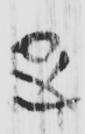疋
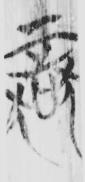獄
